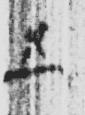之
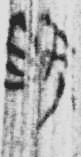肰（然）
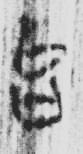句（後）
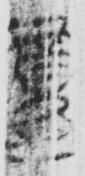○（復）
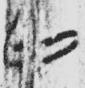㠯（以）
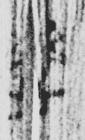教教
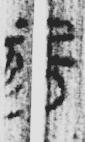所
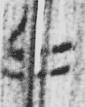㠯（以）
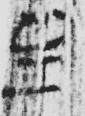生
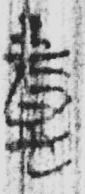惪（德）
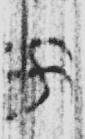于
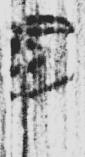𠁩
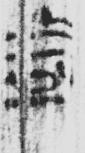者
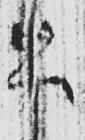也
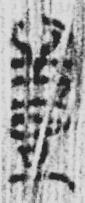○（禮）
